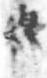綏
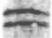二
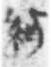紫
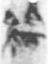○（組）
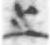之
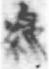綏
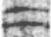二
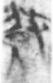○（紛）
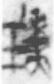○（纁）
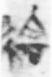○（組）
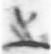之
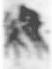綏
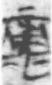彔（綠）
